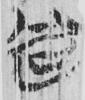甚
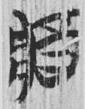𨟻（將）
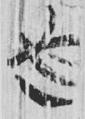必
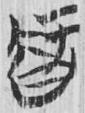智（知）
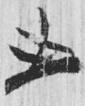之
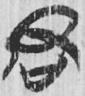君
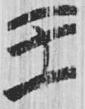王
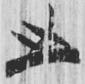之
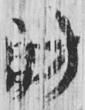○（病）
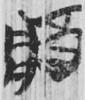𨟻（將）
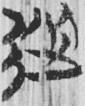從
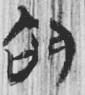含（今）
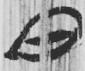日
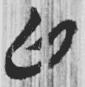㠯（以）
